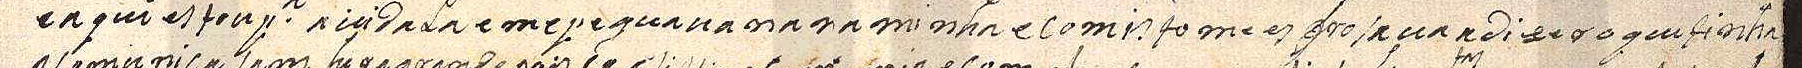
e aqui estou p.a aijidala e me peguaua na na minha e com isto me esfrosaua a dizer o que tinha
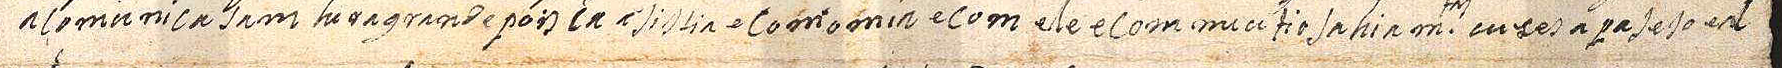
a comunicasam hera grande pois ca asistia e comomia e com ele e com meu tio sahia m.tas uezes a pasejo e al
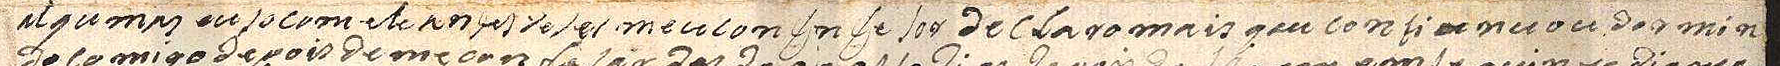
algumas ou so com ele antes de ser meu confnfesor declaro mais que conti_nuou dormin
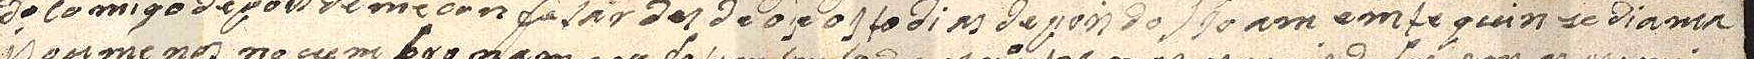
do comigo depois de me confasar desde oje ojto dias depois do s joam emte quinze dia ma
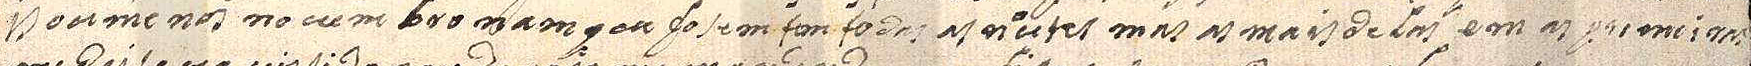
is ou menos nouembro nam que fosem em todas as noutes mas as mais delas em as primeiras
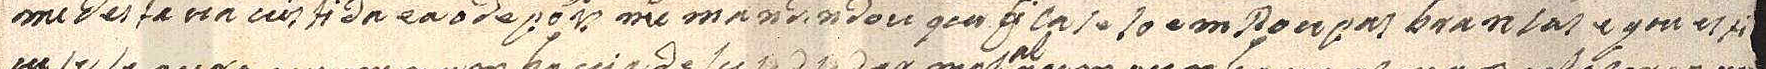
me deitaua uistida e ao depois me mandndou que ficase so em Roupas brancas e que esti
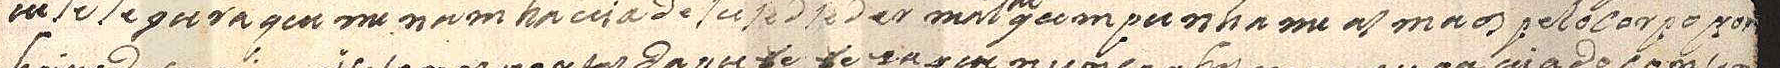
uese segura que me nam hauia de susedseder mal algum punha me as maos pelo corpo por
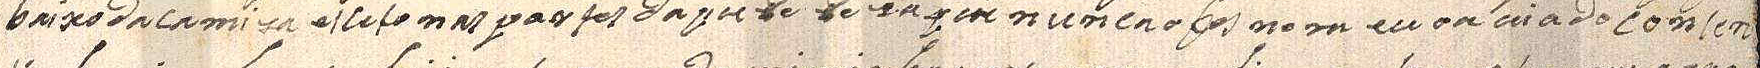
baixo da camisa esceto nas partes da purereza que nunca o fes nem eu o auia do consen
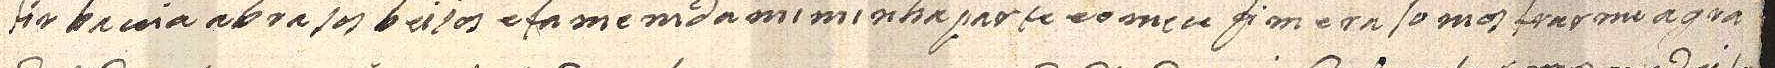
tir hauia abrasos beiios e tamem da miminha parte e o meu fim era so mostrarme agra
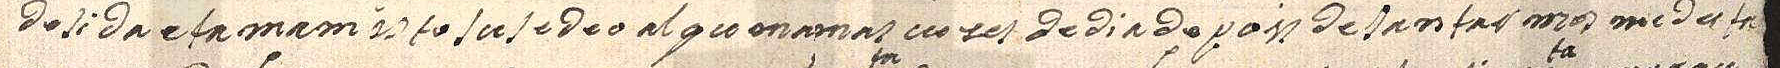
desida e tamam isto susedeo algumamas uezes de dia depois de jantarmos me deita
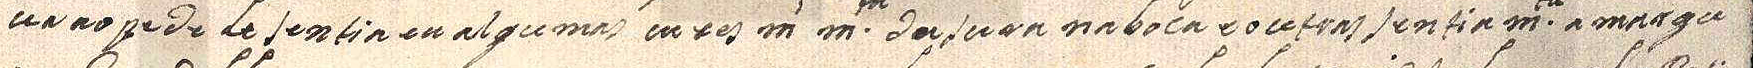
ua ao pe dele sentia eu algumas uezes mm.ta dusura na boca e outras sentia m.ta amargu
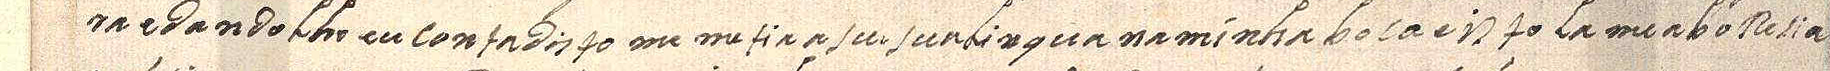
ra e dandolhe eu conta disto me metia a susua linqua na minha boca e isto la me aboResia
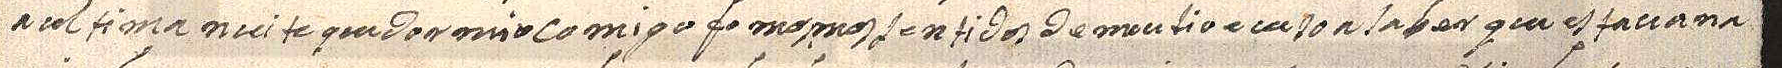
a ultima nuite que dormio comigo fomos mos sentidos de meu tio e cujo a saber que estaua na
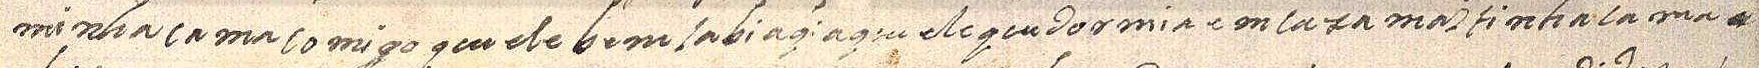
minha cama comigo que ele bem sabia q a que ele que dormia em caza mas tinha cama
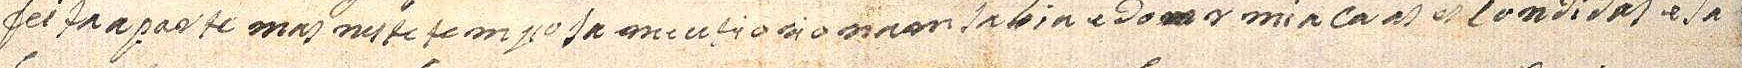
feita a parte mas neste tempo ja meu tio o nam sabia e domrmia ca as escondidas e sa
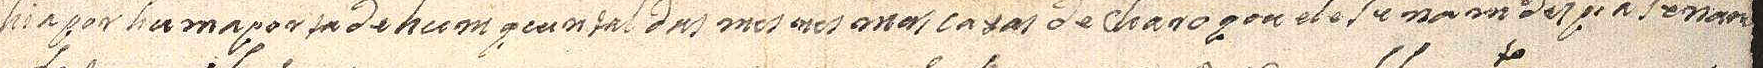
hia por huma porta de hum quental das mes esmas cazas declaro que ele se nam despia senam
